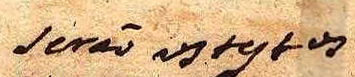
seraõ os testos
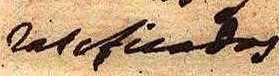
rateficados
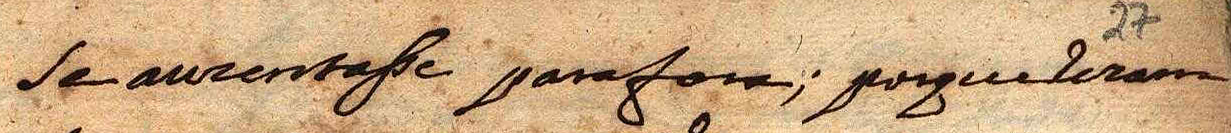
se auzentasse para fora; porque Rezam
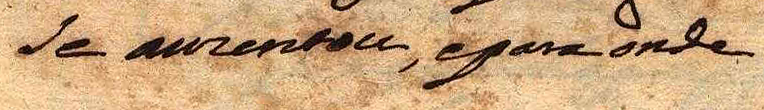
se auzentou, e para onde
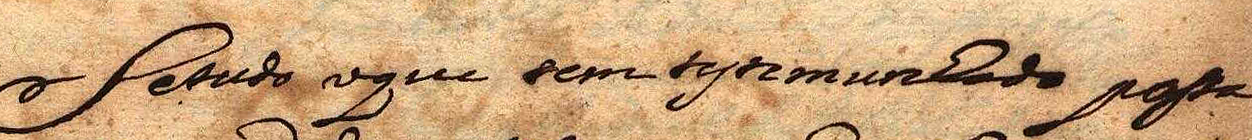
Se tudo o que tem testemunhado passa
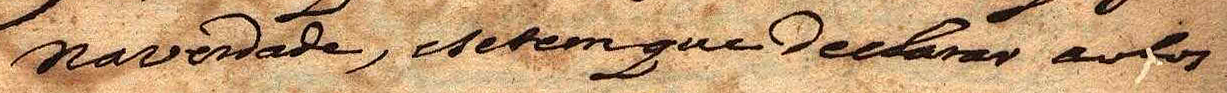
na verdade, e se tem que declarar ao cos
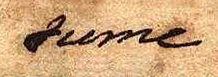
tume
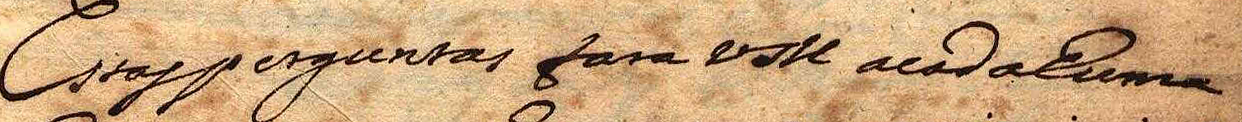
Estas perguntas fara v M a cada huma
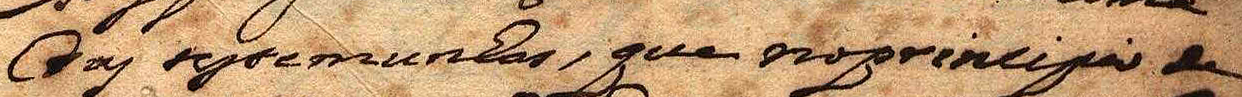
das testemunhas, que no principio de
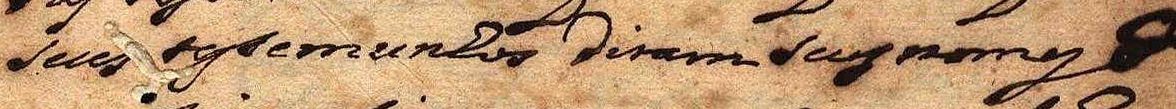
seus testemunhos diram seus nomes
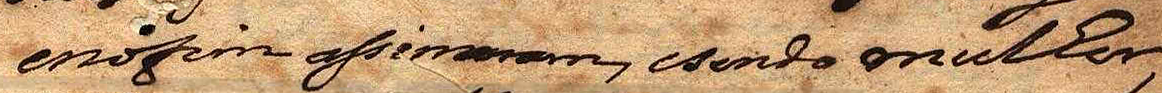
e no fim assinaram, e sendo mulher,
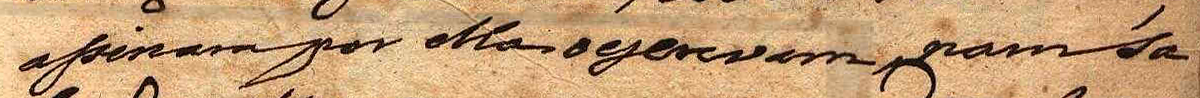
assinara por ella o escrevam, nam sa
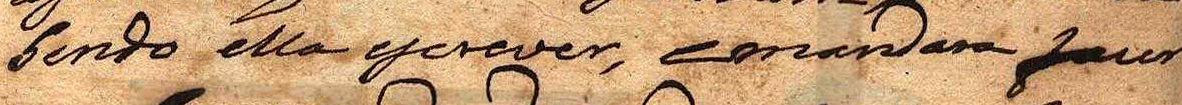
bendo ella escrever, e mandara fazer
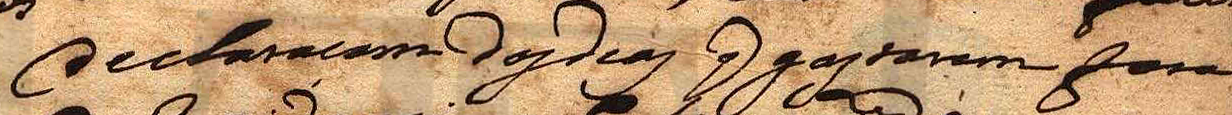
declaraçam dos dias q̄ gastaram fora
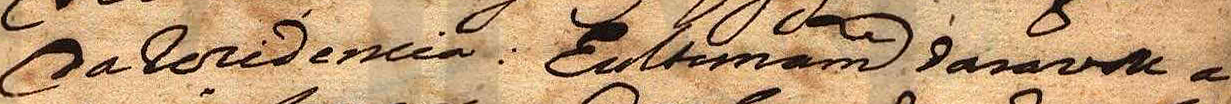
da Rezidencia: E ultimamte dara v M a
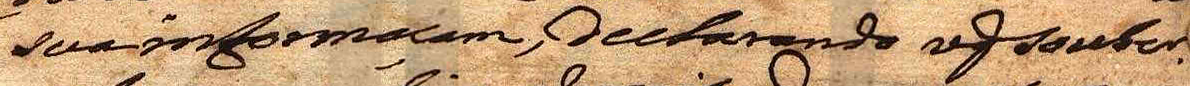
sua informaçam, declarando o q̄ souber,
